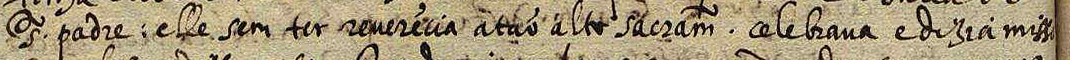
sto. padre: elle sem ter reuerēcia a taõ alto sacramto. celebraua e dizia missa
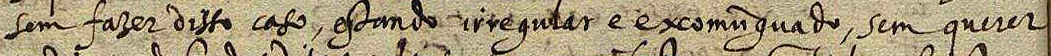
sem fazer disso caso, estando irregular e excomūguado, sem querer
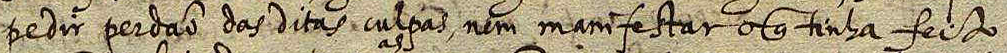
pedir perdaõ das ditas culpas, nem manifestar o q̄ tinha feito
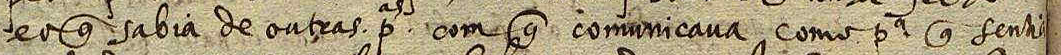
e o q̄ sabia de outras pas. com q̄ comunicaua como pa. q̄ sentia
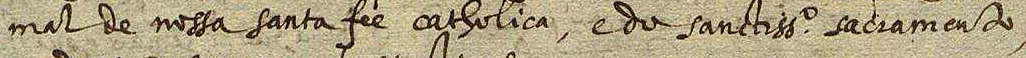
maL de nossa santa fee catholica, e do sanctiss.o sacramento,
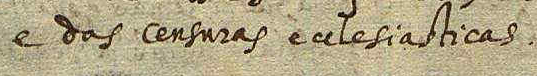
e das censuras ecclesiasticas.
